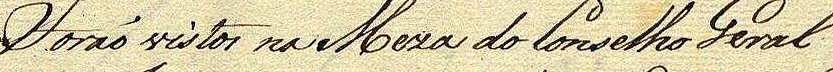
Foraõ vistos na Meza do Conselho Geral
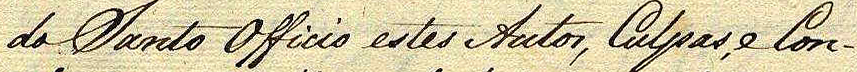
do Santo Officio estes Autos, Culpas, e Con
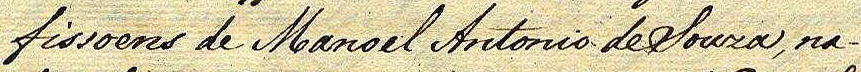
fissoens de Manoel Antonio de Souza, na
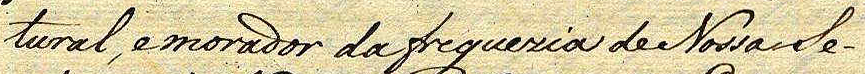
tural, e morador da freguezia de Nossa Se
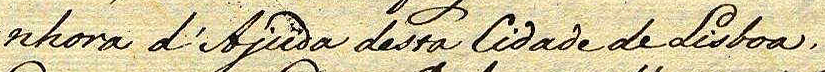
nhora d'Ajuda desta Cidade de Lisboa,
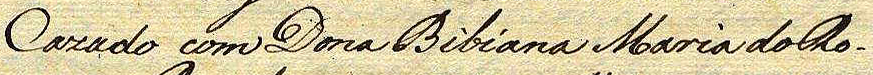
Cazado com Dona Bibiana Maria do Ro
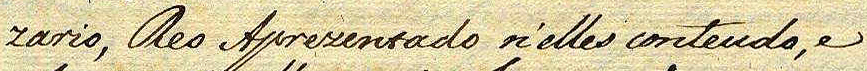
zario, Reo Aprezentado n'elles conteudo, e
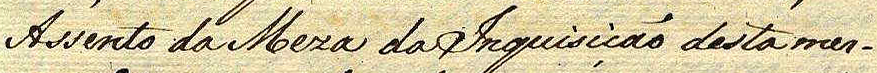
Assento da Meza da Inquisiçaõ desta mes
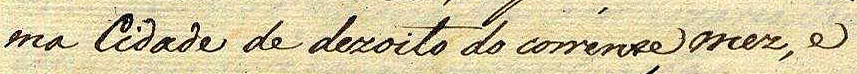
ma Cidade de dezoito do corrente mez, e
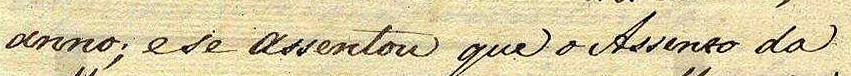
anno; e se assentou que o Assento da
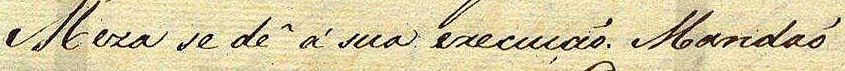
Meza se dê á sua execuçaõ. Mandaõ
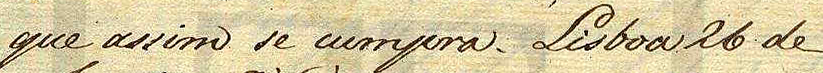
que assim se cumpra. Lisboa 26 de
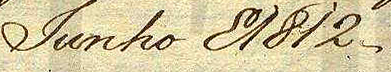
Iunho d̄ 1812
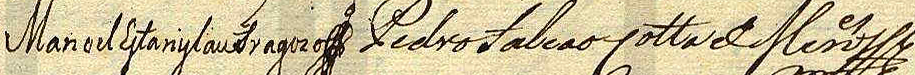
Manoel Estanislau Fragozo Pedro Falcao Cotta de Menz.es
